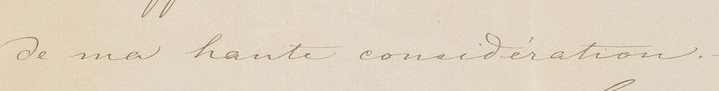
de ma haute considération. –
